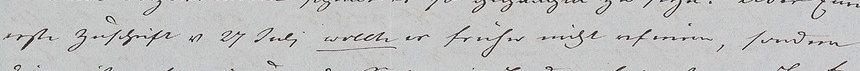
erste Zuschrift v 27 Juli wollte es früher nicht referiren, sondern
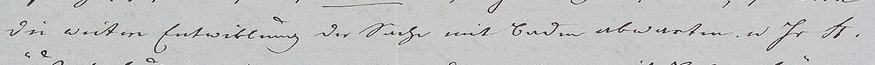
die weitere Entwicklung der Sache mit Baden abwarten u Hr St.
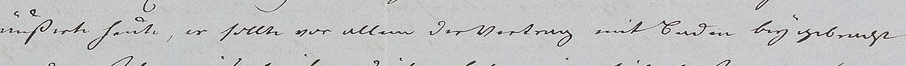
äußerte heute, es sollte vor allem der Vertrag mit Baden beygebracht
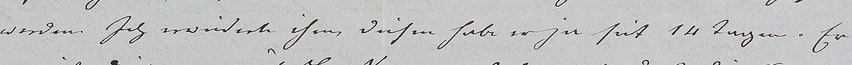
werden. Ich erwiederte ihm, diesen habe er ja seit 14 Tagen. Er
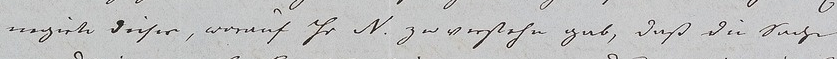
negirte dieses, worauf Hr N. zu verstehn gab, daß die Sache
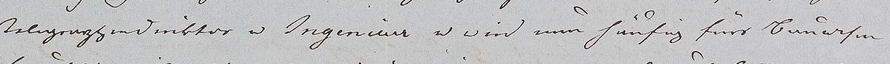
Telegraphendirektor u Ingenieur u wird nun häufig fürs Bauwesen
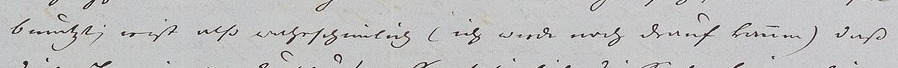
benutzt; es ist also wahrscheinlich (ich werde noch drauf kommen) daß
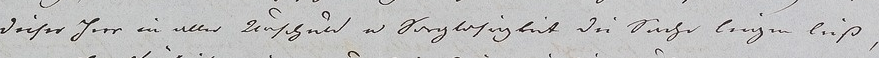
dieser Herr in aller Unschuld u Sorglosigkeit die Sache liegen ließ,
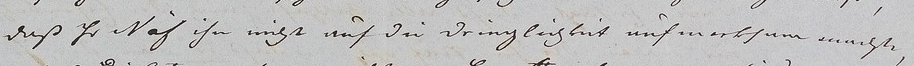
daß Hr Näf ihn nicht auf die Dringlichkeit aufmerksam machte,
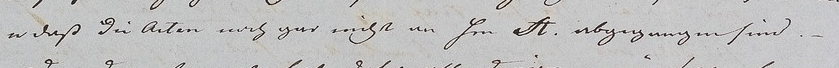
u daß die Acten noch gar nicht an Hrn St. abgegangen sind. –
